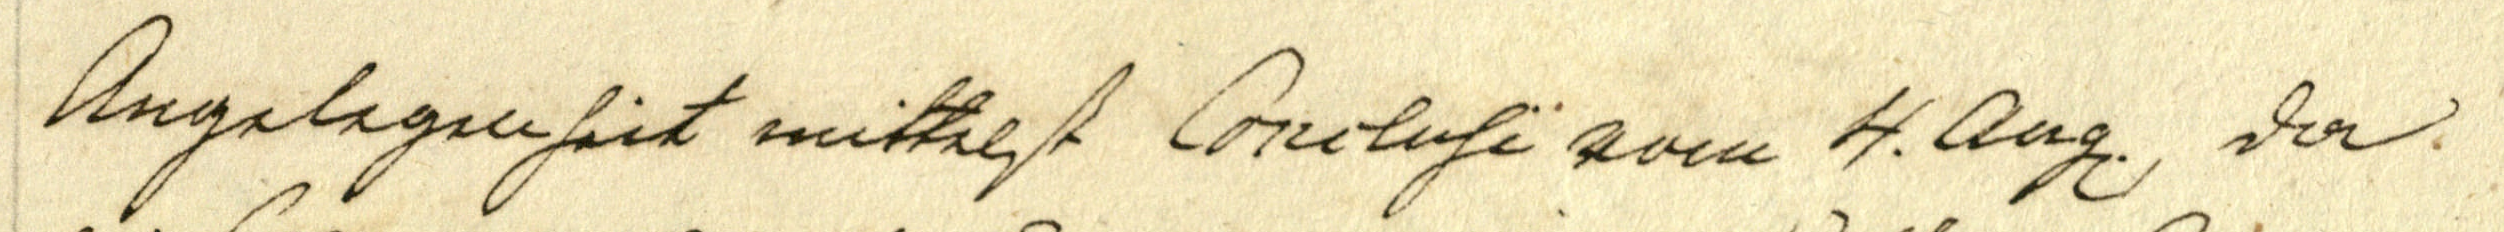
Angelegenheit mittelst Conclusi vom 4. Aug. da
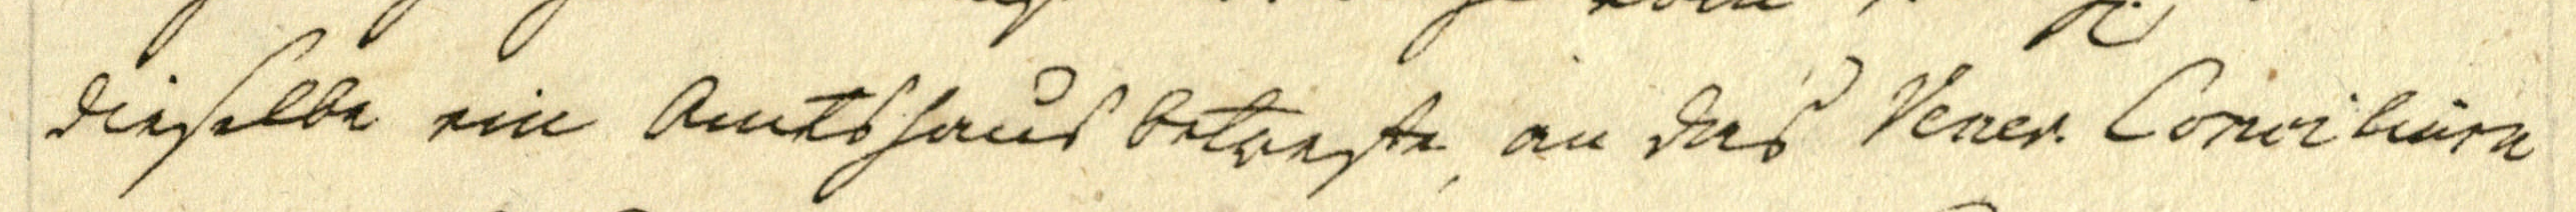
dieselbe ein Amtshaus betrefe, an das Vener. Concilium
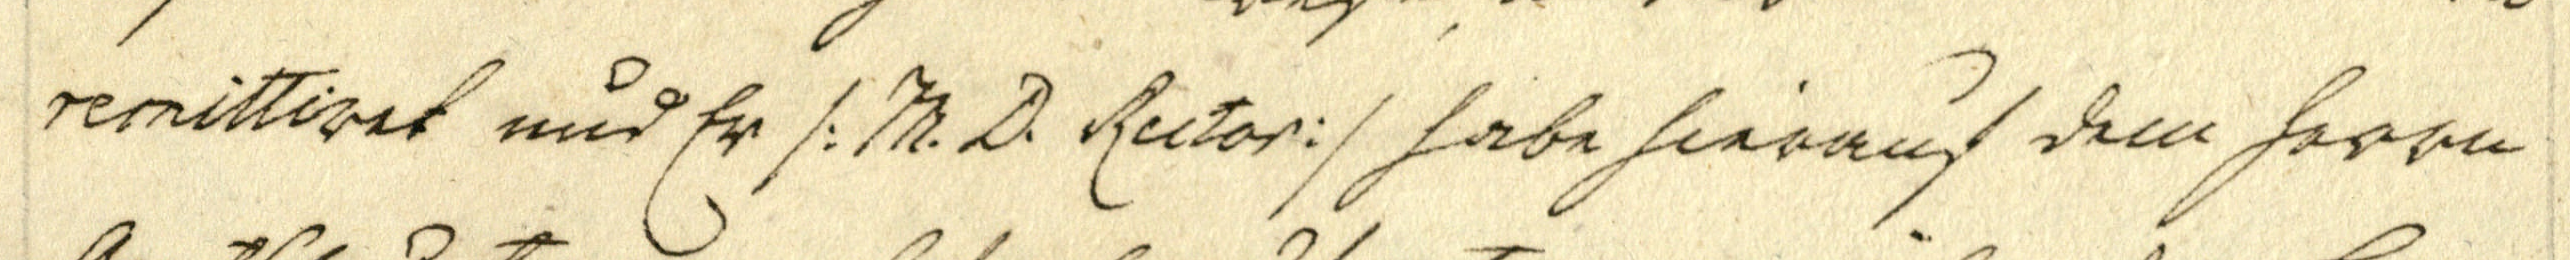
remittiret und Er / M. D. Rector / habe hierauf dem herrn
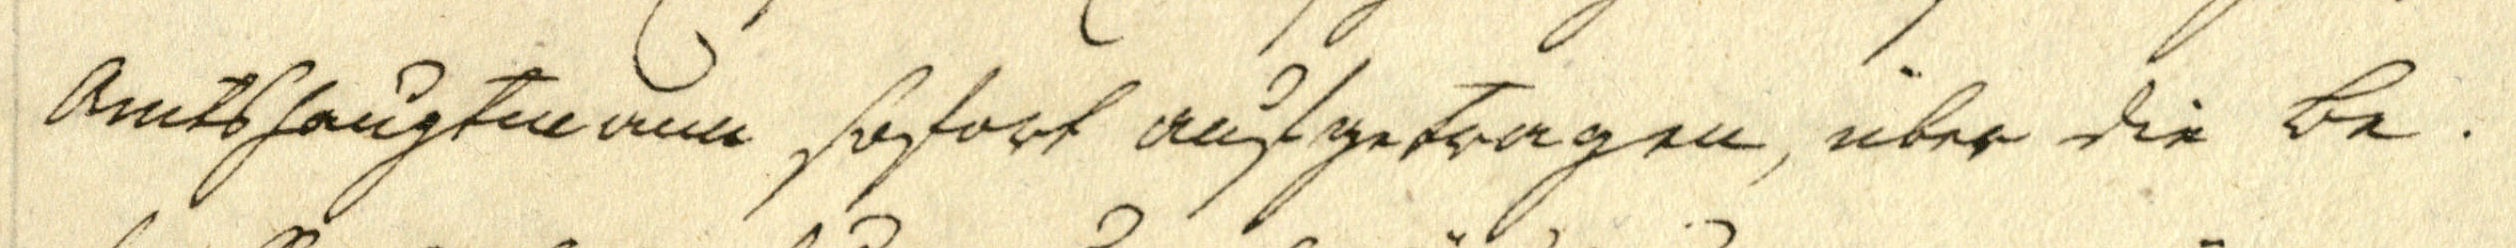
Amtshauptmann sofort aufgetragen, über die Be¬
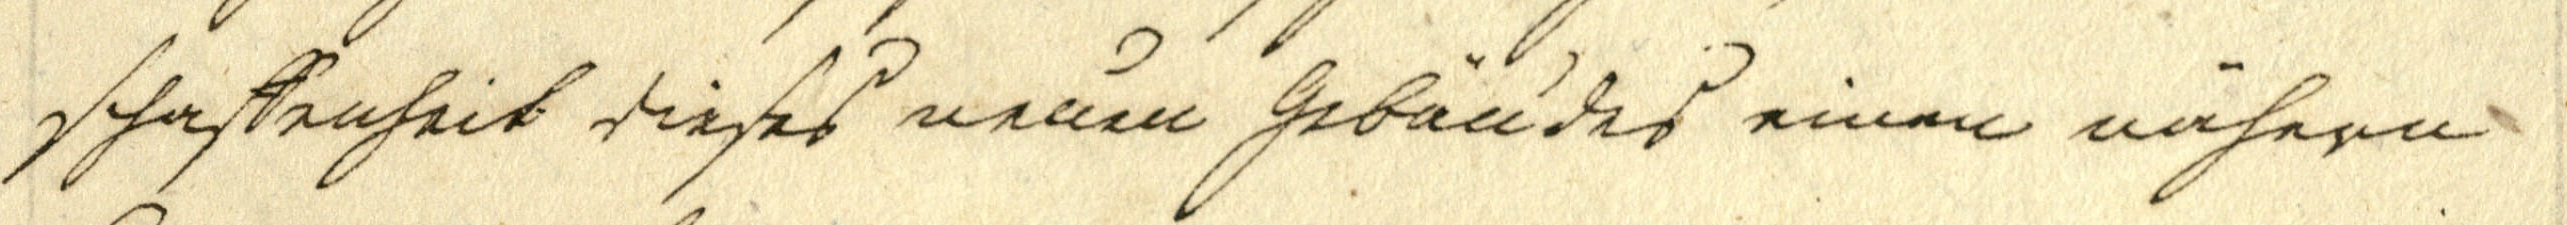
schaffenheit dieses neuen Gebäudes einen nähern
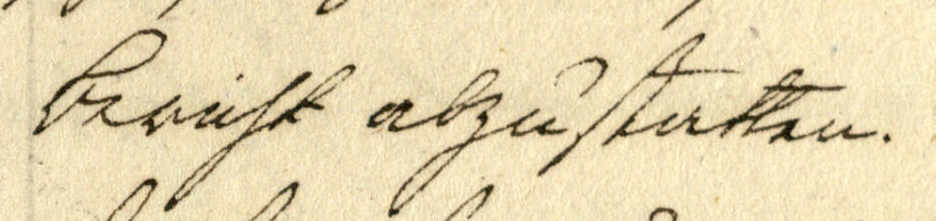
Bericht abzustatten.
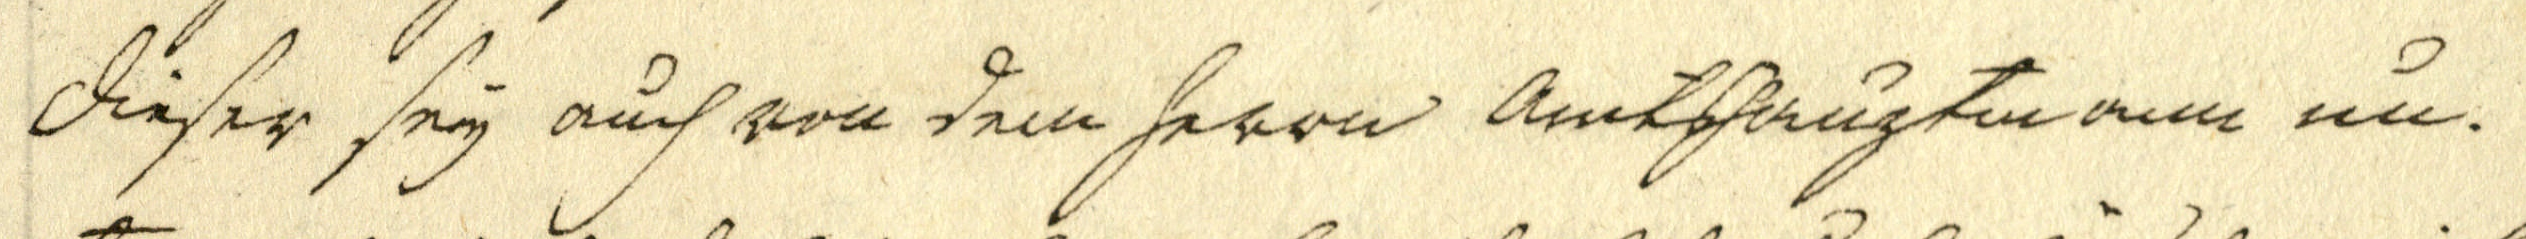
Dieser seÿ auch von dem herrn Amtshauptmann un¬
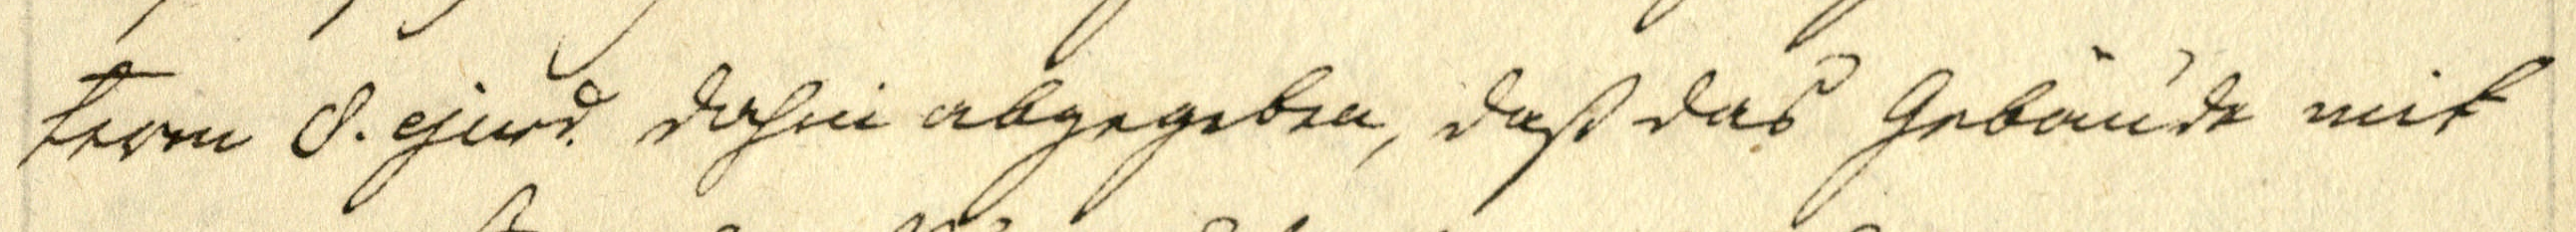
term 8. ejusd. dahin abgegeben, daß das Gebäude mit
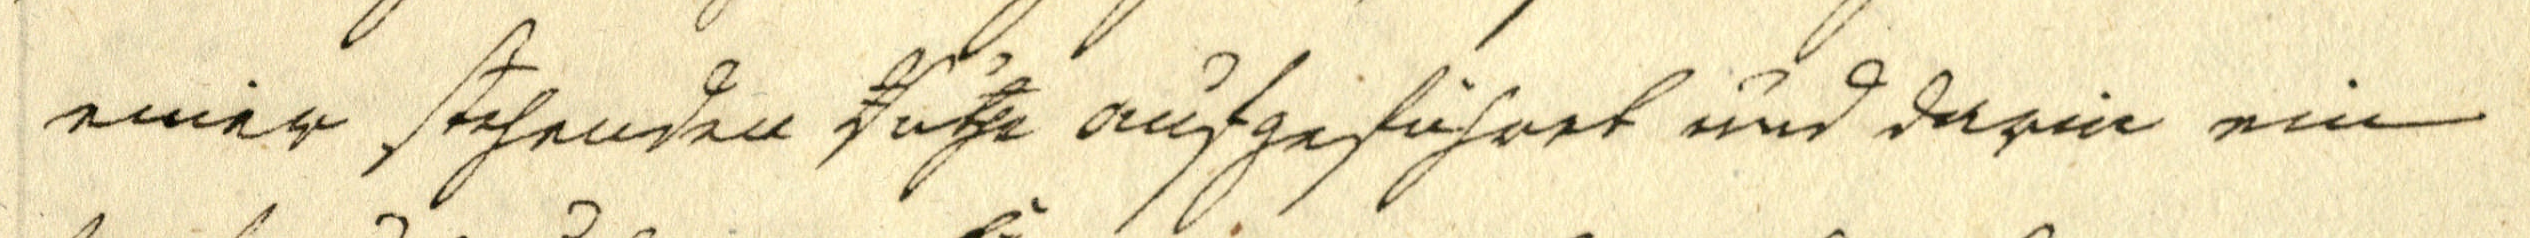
einer stehenden Ruthe aufgeführet und darin ein
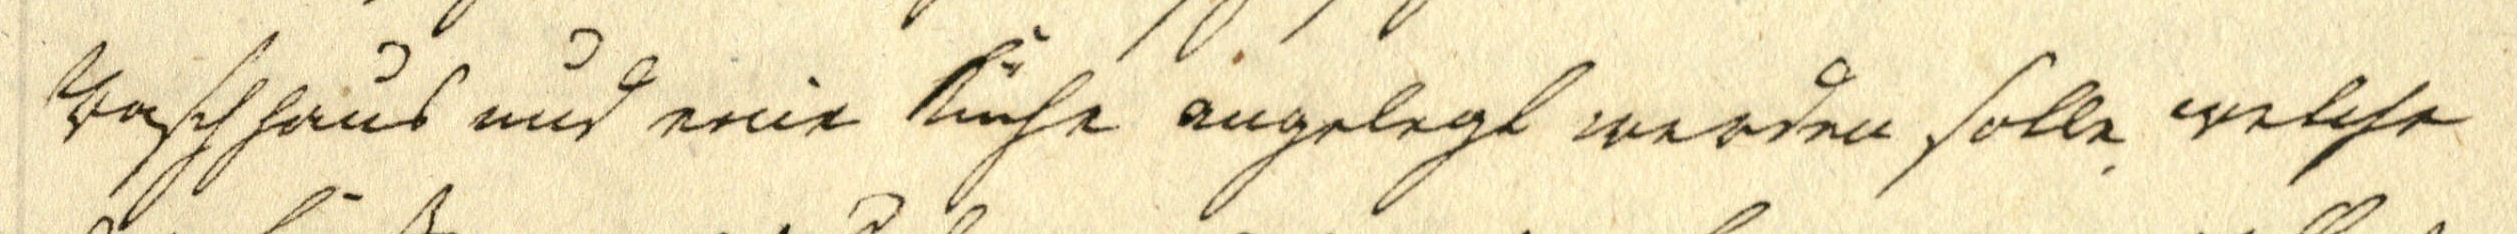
Waschhaus und eine Küche angelegt werden solle welche
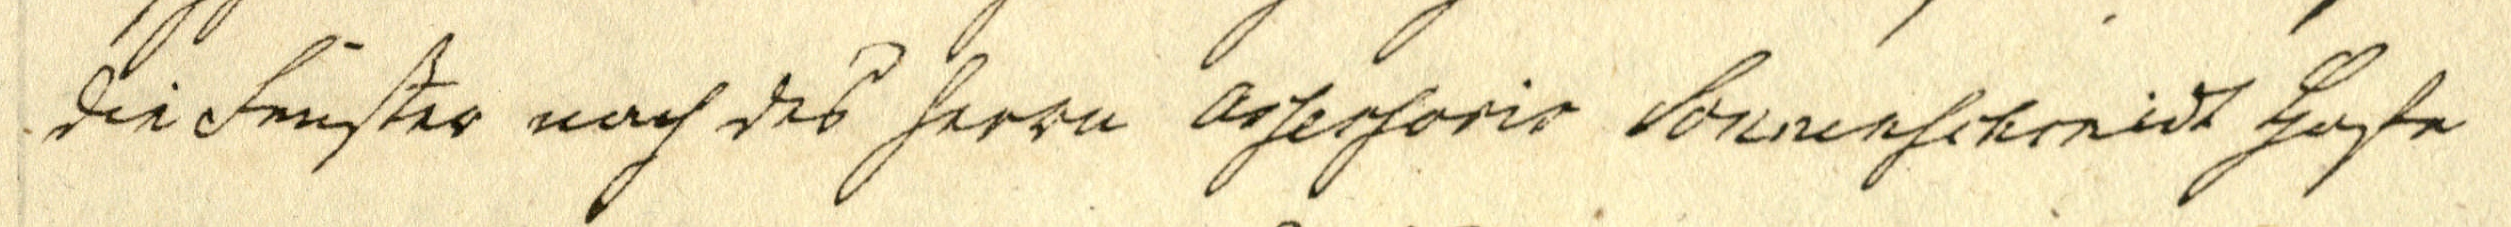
die Fenster nach des herrn Assessoris Sonnenschmidt Hofe
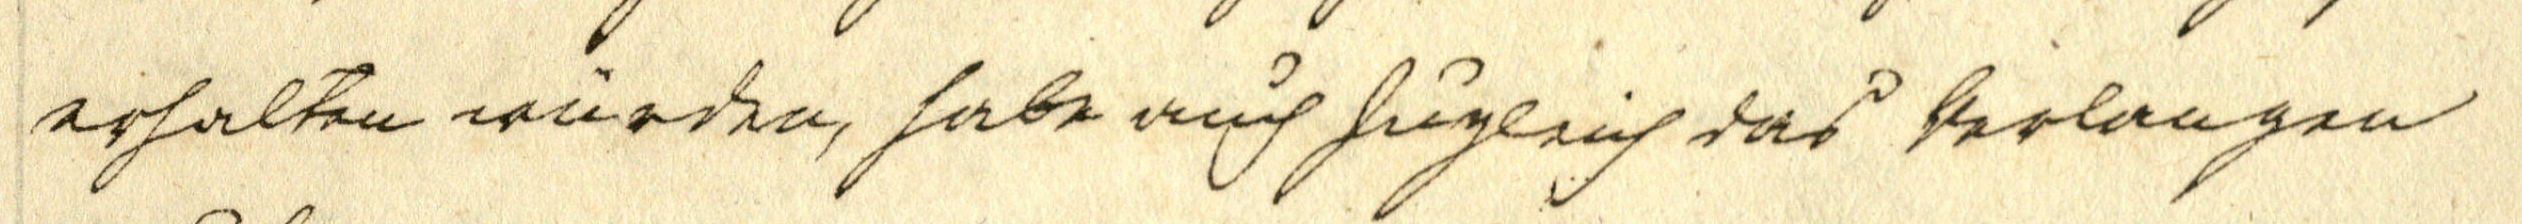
erhalten würden, habe auch zugleich das Verlangen
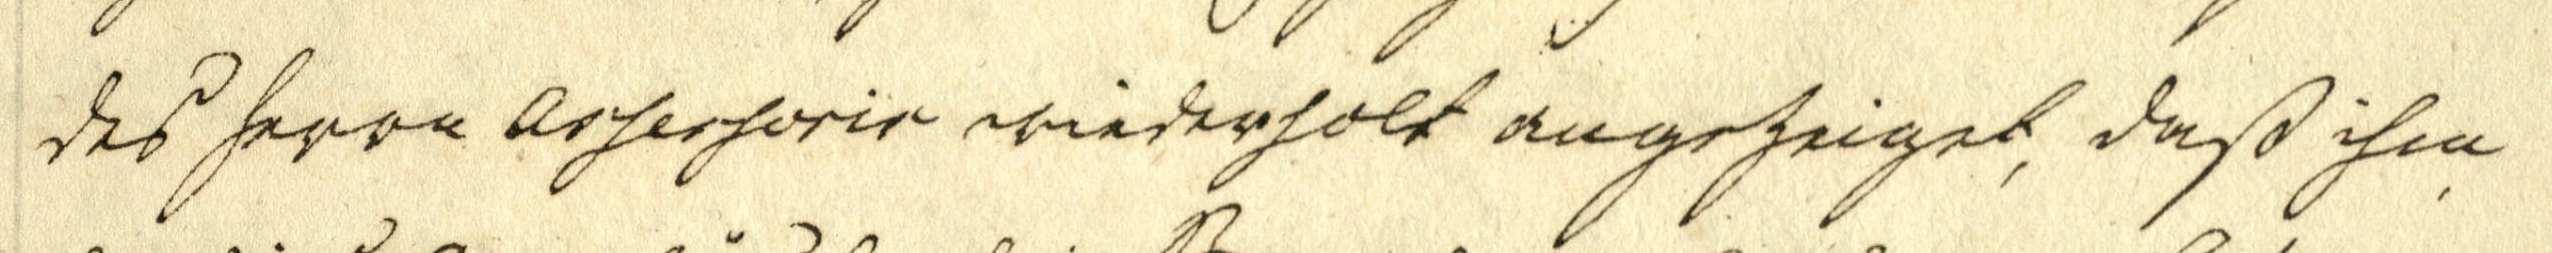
des herrn Assessors wiederholt angezeiget, daß ihm
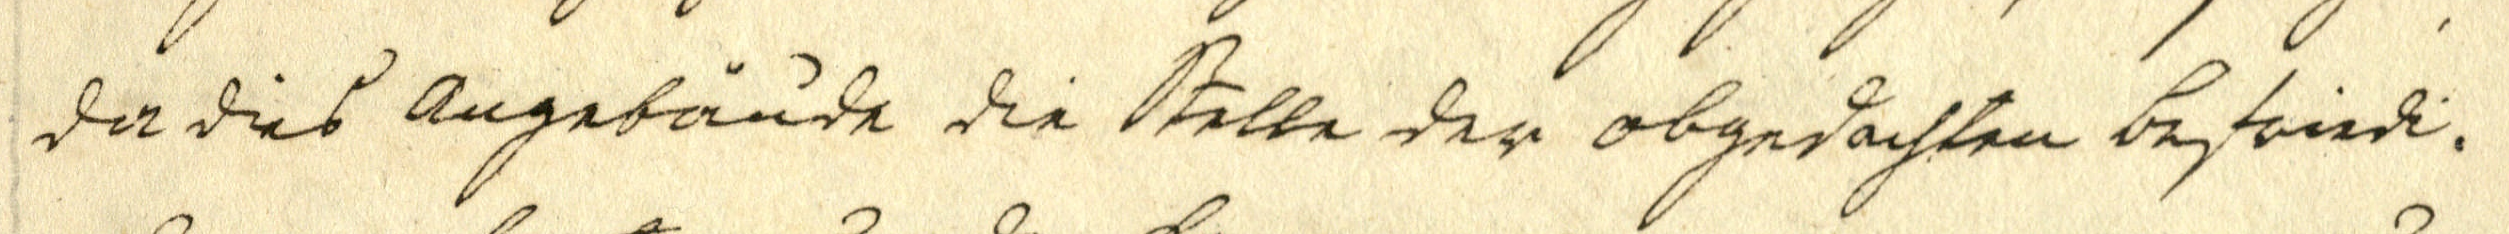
da dies Angebäude die Stelle der obgedachten Befriedi¬
